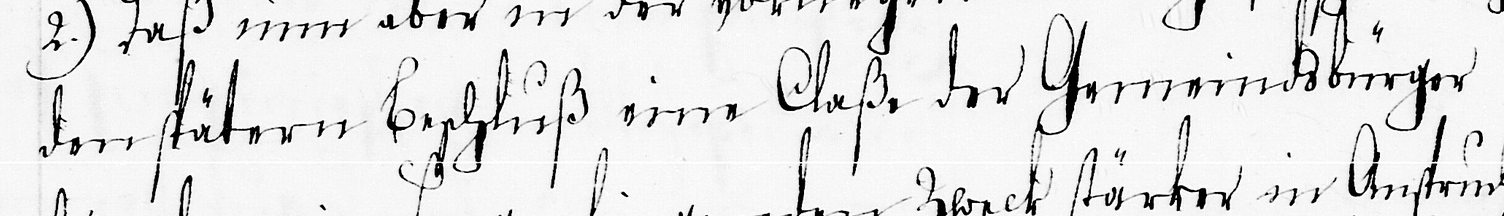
den spätern Beschluß eine Claße der Gemeindsbürger
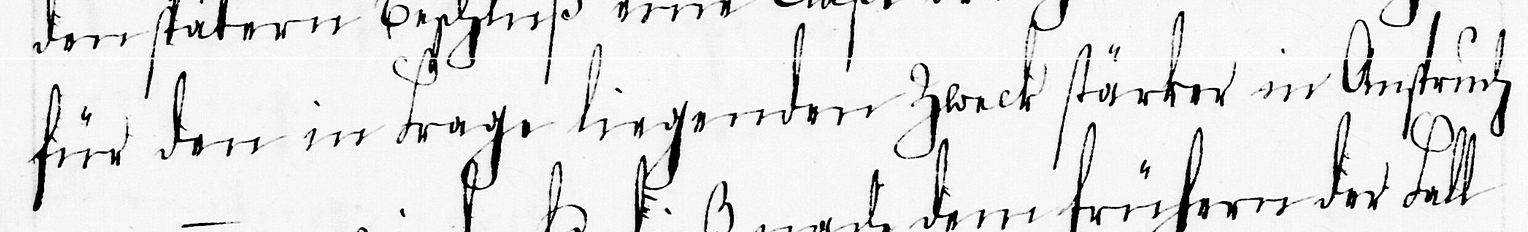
für den in Frage liegenden Zweck stärker in Anspruch
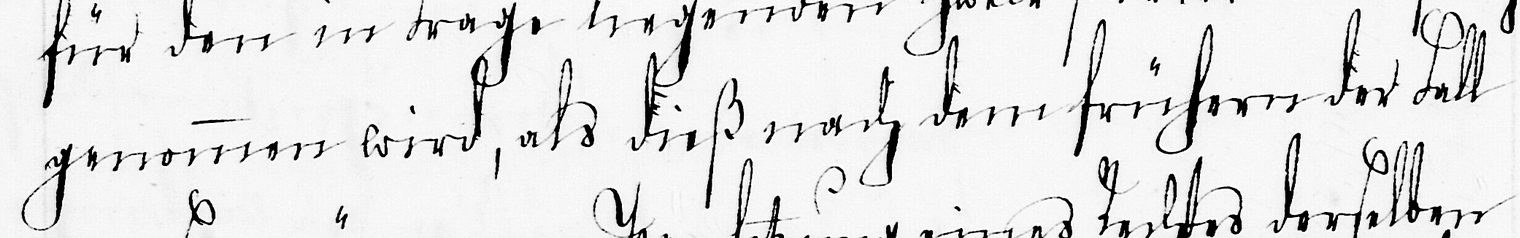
genommen wird, als dieß nach dem frühern der Fall
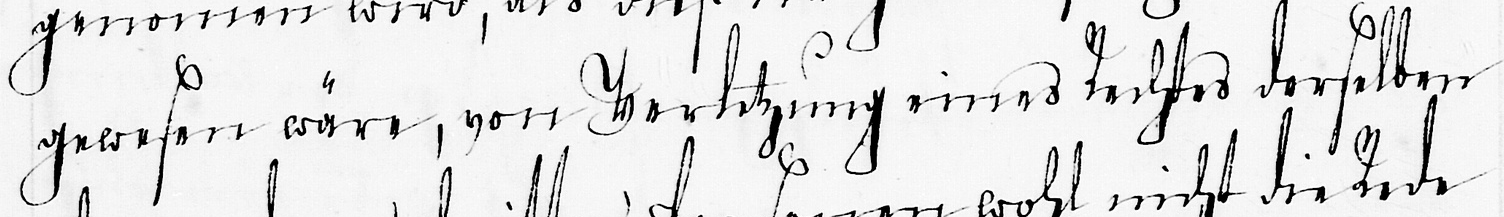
gewesen wäre, von Verletzung eines Rechtes derselben
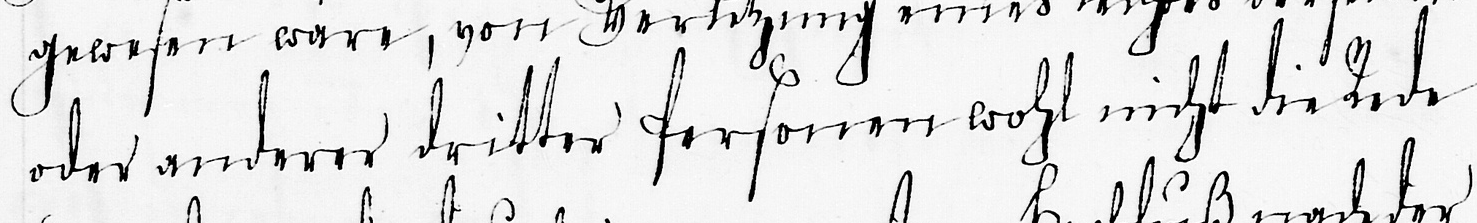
oder anderer dritter Personen wohl nicht die Rede
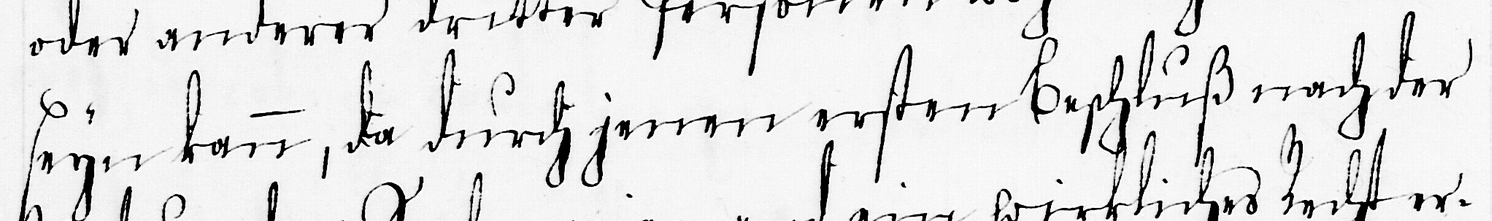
seyn kann, da durch jenen ersten Beschluß nach der
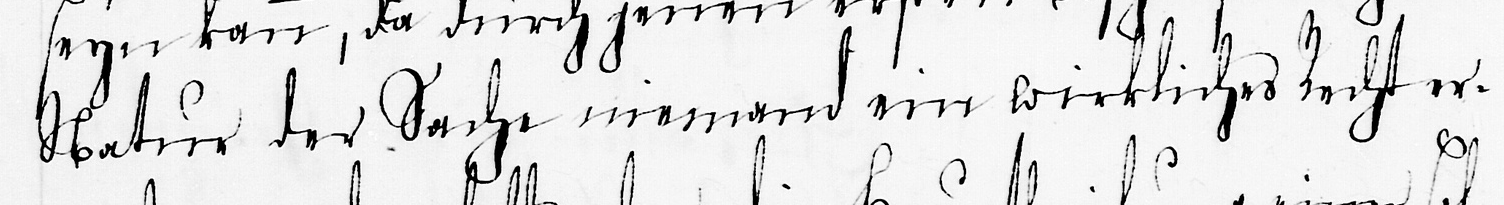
Natur der Sache niemand ein wirkliches Recht er¬
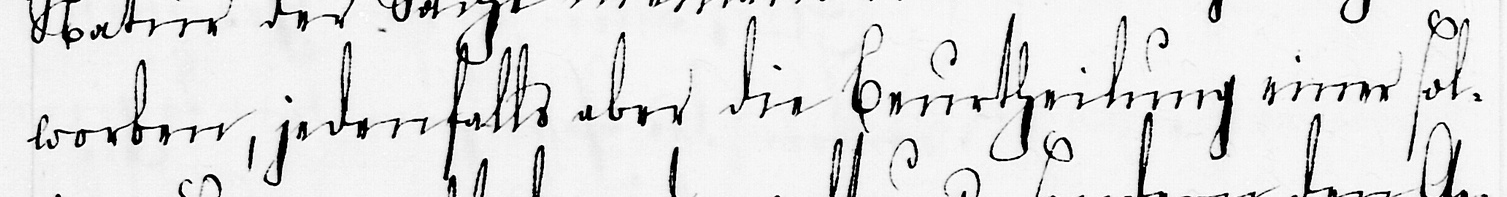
worben, jedenfalls aber die Beurtheilung einer sol¬
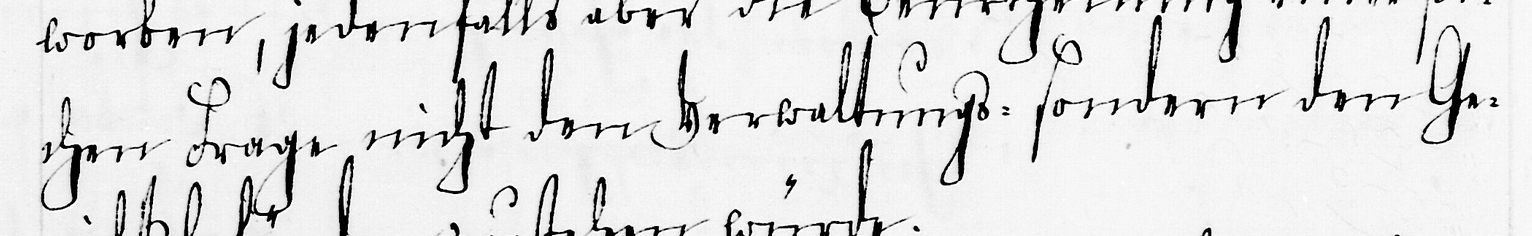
chen Frage nicht den Verwaltungs- sondern den Ge¬
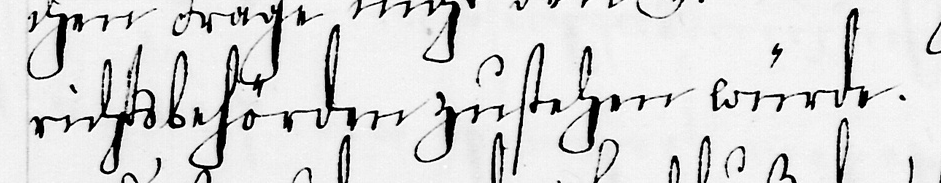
richtsbehörden zustehen würde.
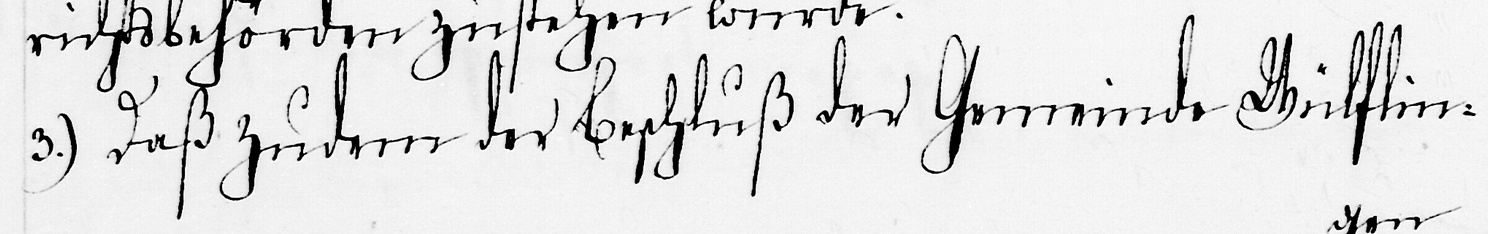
3.) Daß zudem der Beschluß der Gemeinde Wülflin-
